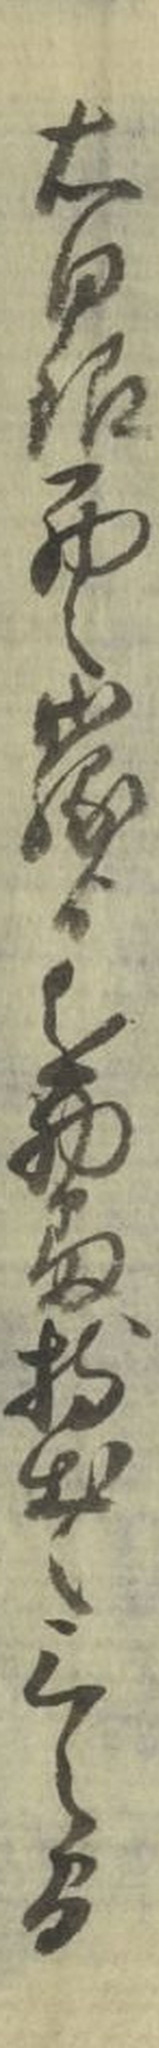右白銀西之御縁ゟ進物番持出之三之間
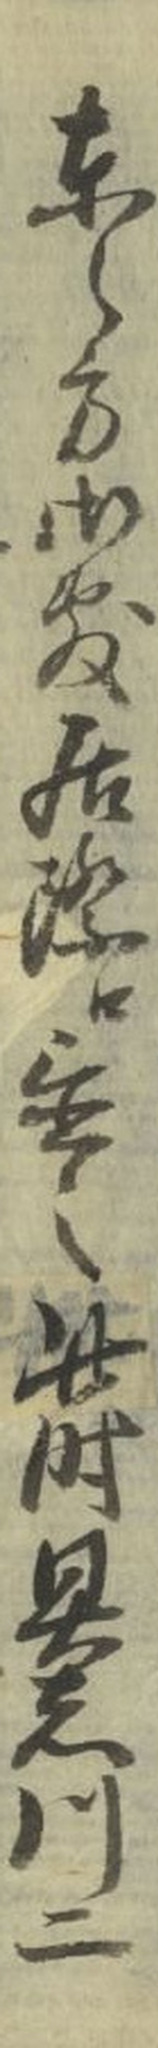東之方御敷居際え置之此時具志川二
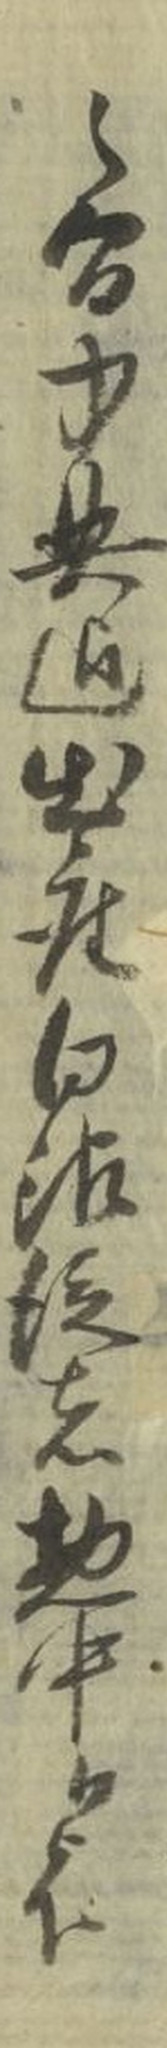之間中央迄出座白銀従者惣中え被下
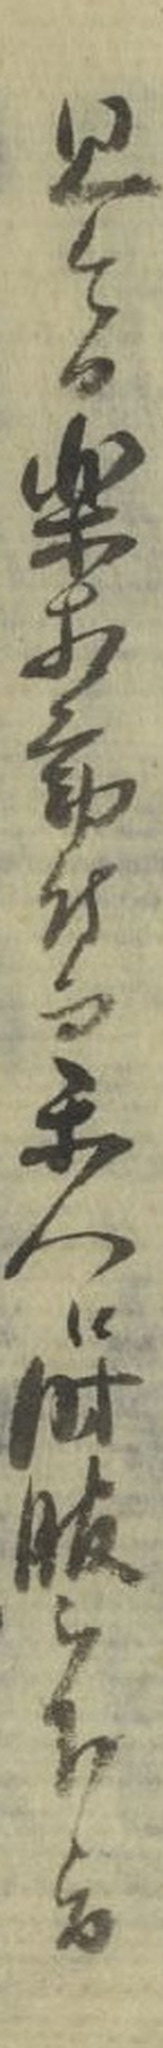且今日楽相勤付て楽人え時服被下旨
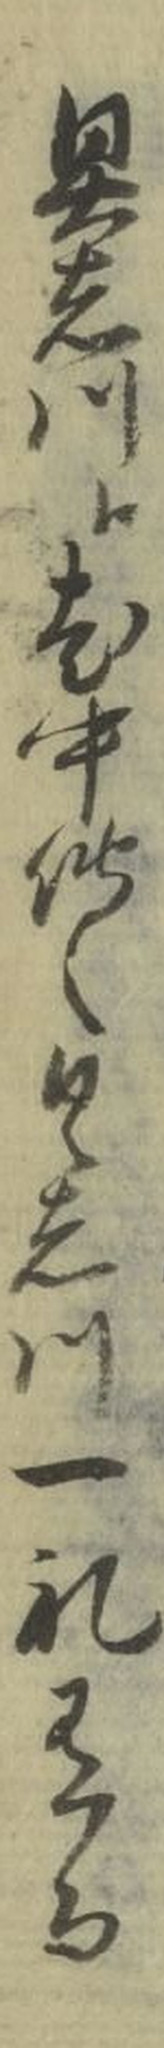具志川え老中伝之具志川一礼有て

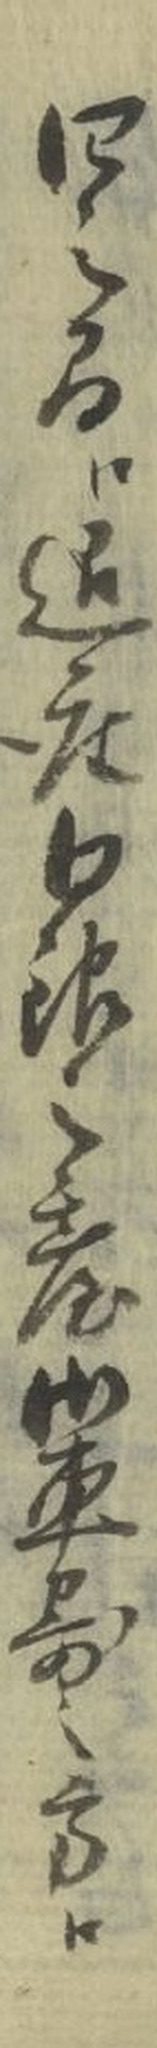四之間え退座白銀之台御車寄之方え
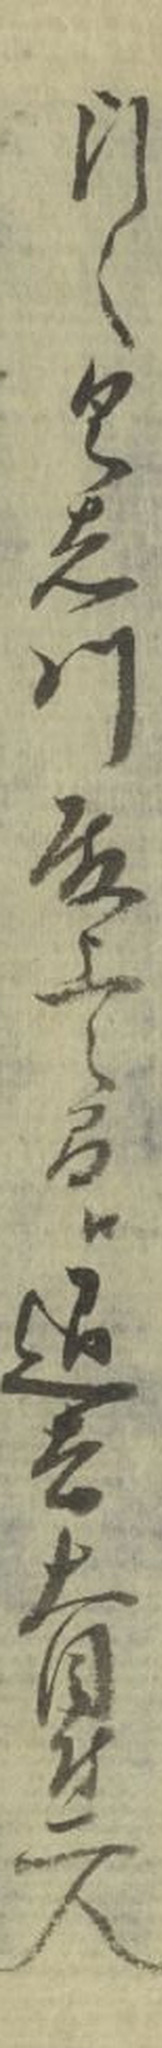引之具志川殿上之間え退去大目付二人
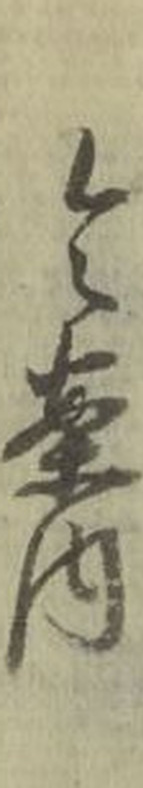令案内
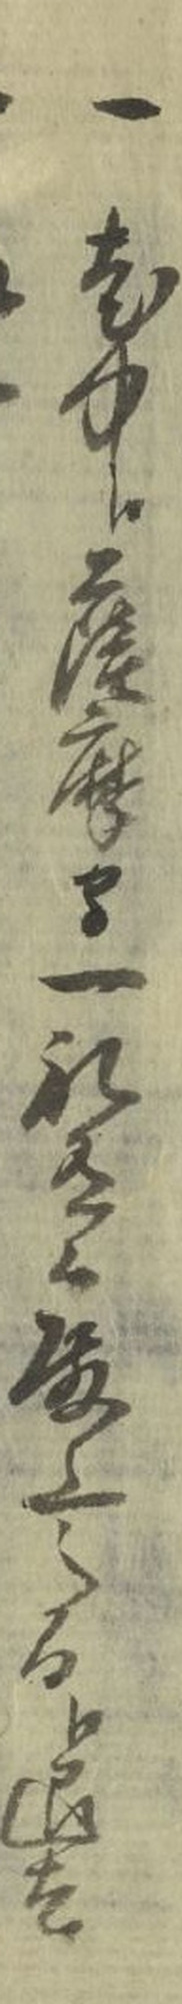一老中え薩摩守一礼有て殿上之間え退去
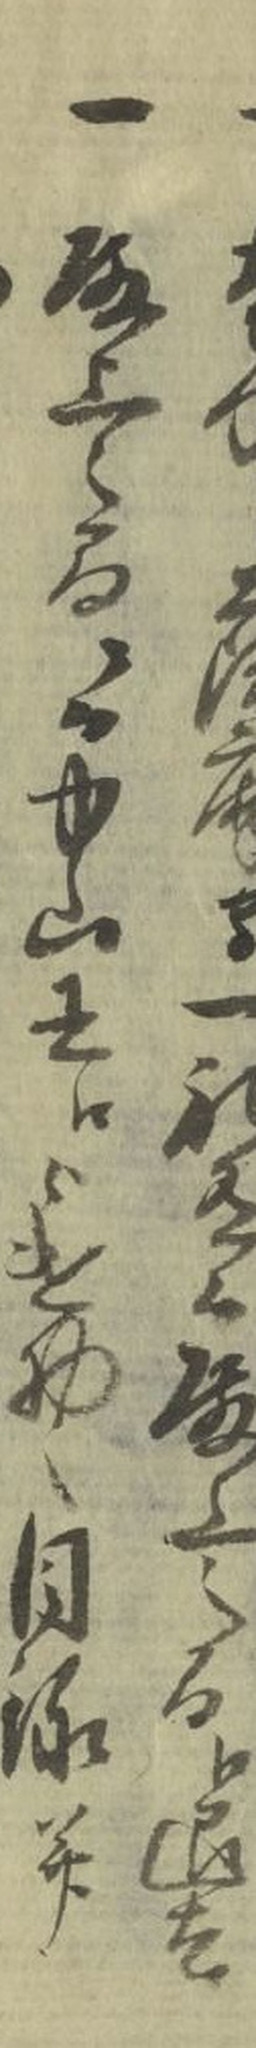一殿上之間にて中山王え被遣物之目録并
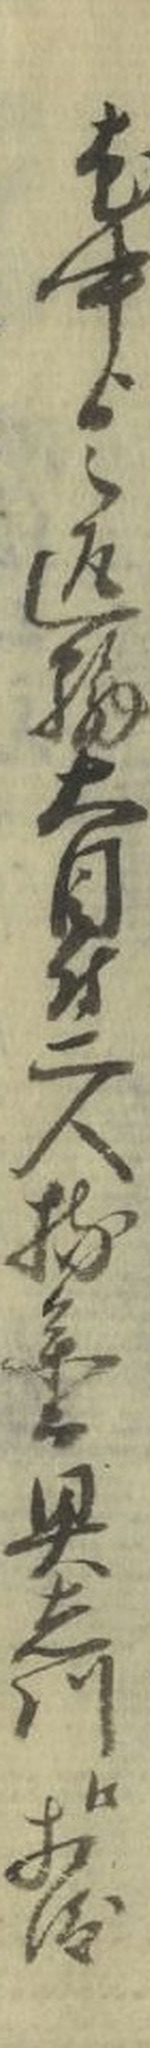老中ゟ之返翰大目付二人持参而具志川え相渡
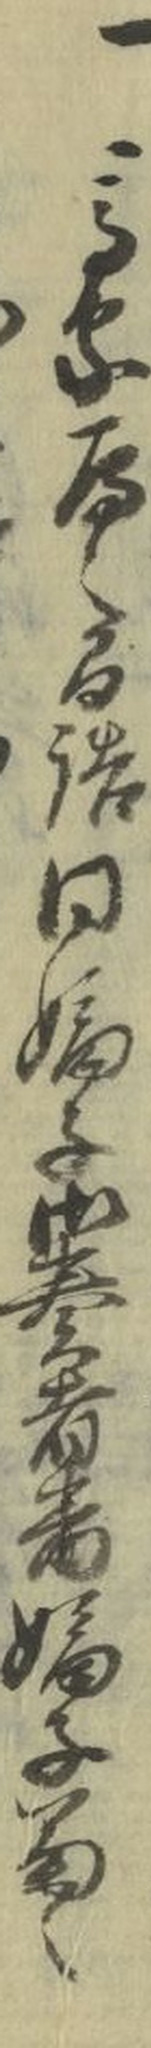一高家鴈之間詰同嫡子御奏者番嫡子菊之
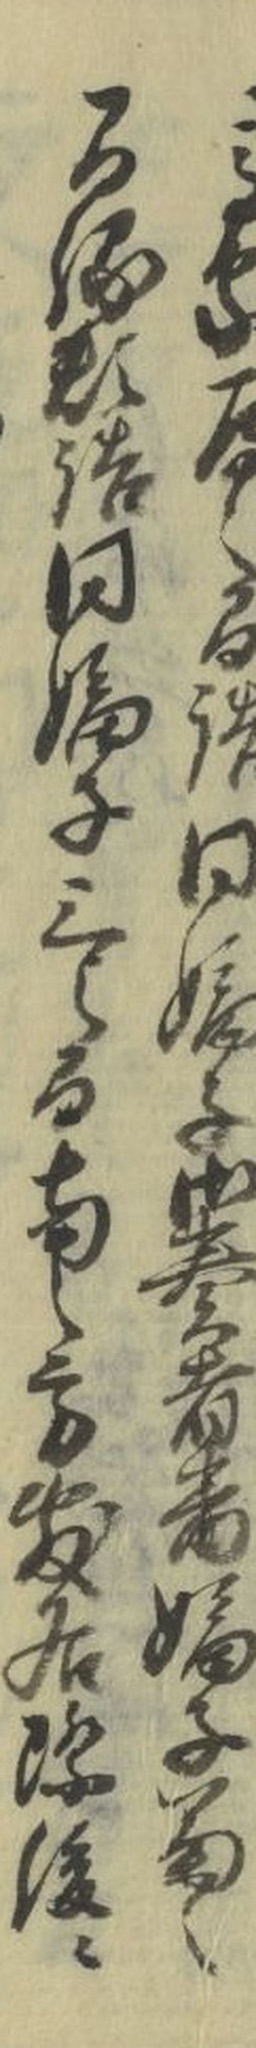間縁頬詰同嫡子三之間南之方敷居際後に
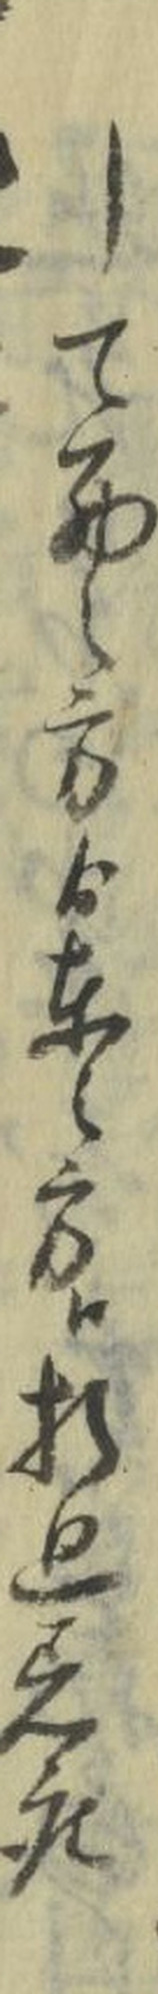して西之方ゟ東之方え折廻着座
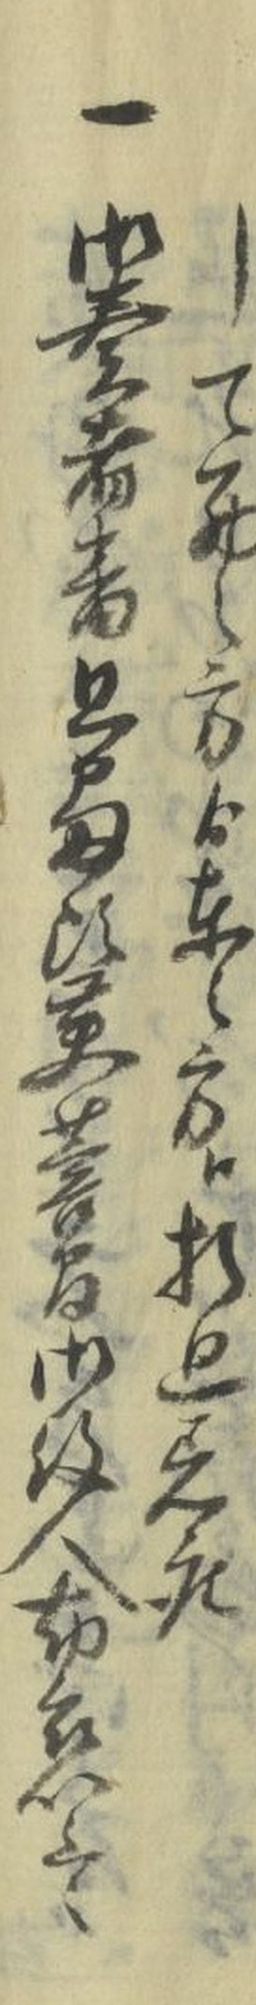一御奏者番且番頭芙蓉間御役人布衣以上之
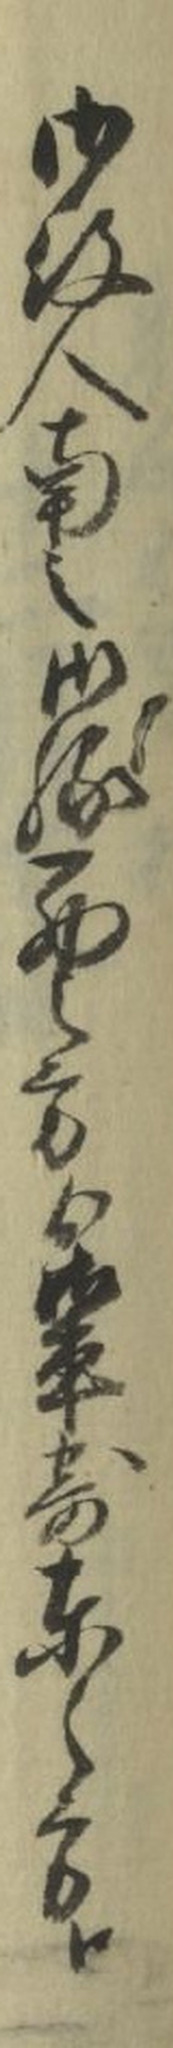御役人南之御縁西之方ゟ御車寄東之方え
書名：戊辰琉球人来朝之式 全
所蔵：University of the Ryukyus Library
